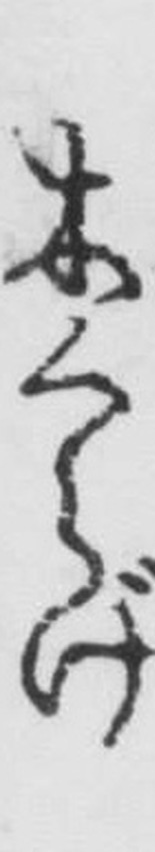木くらげ

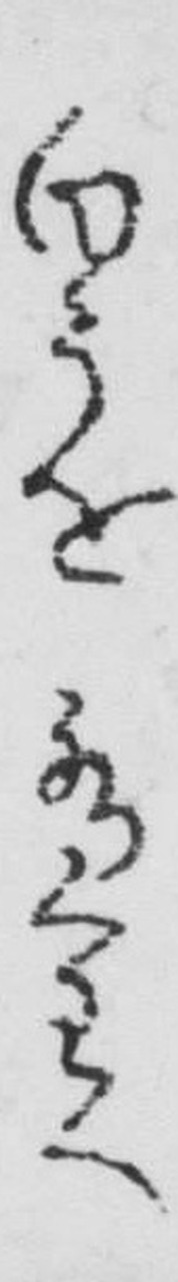白うを水くわへ
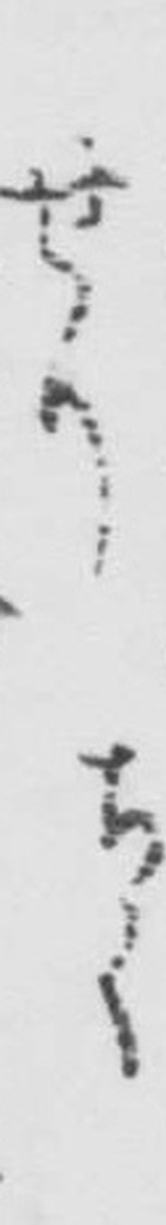せりちく
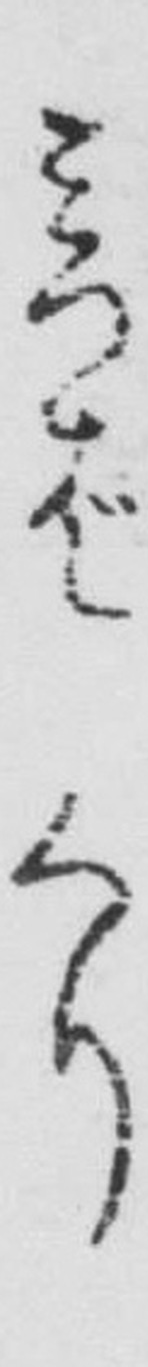みつばくり
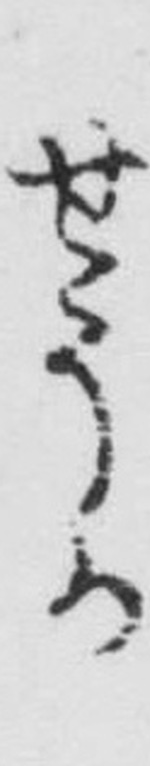せうか
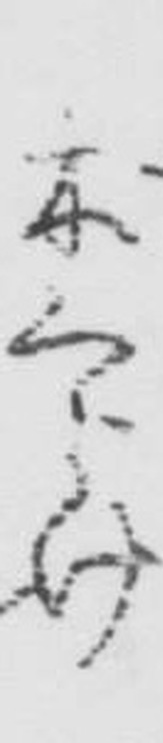木くらけ
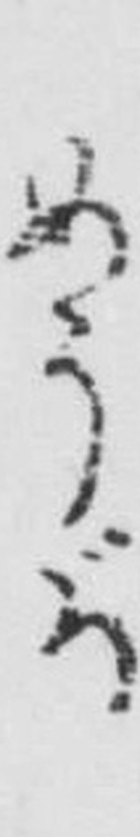せうが
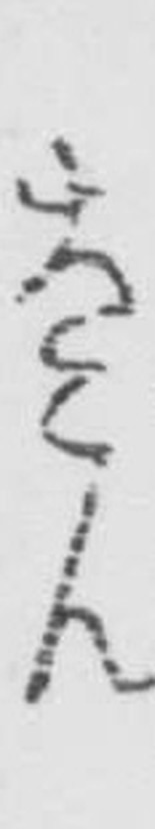大こん
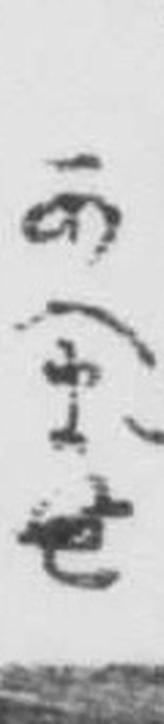あへませ
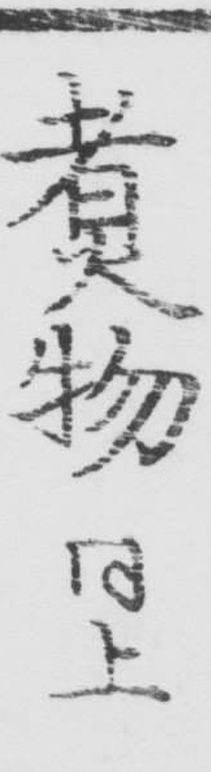煮物同上
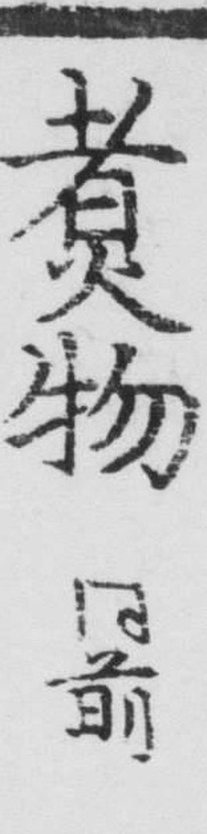煮物同前
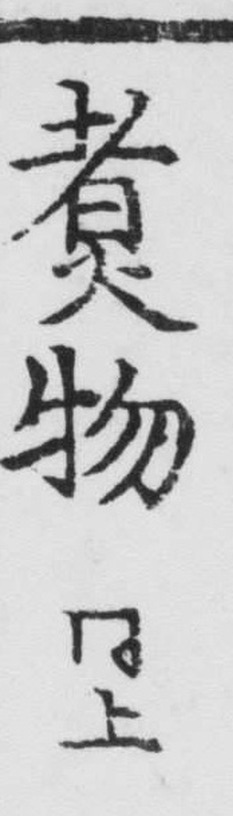煮物同上
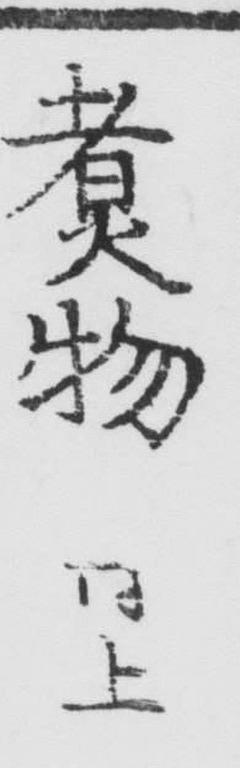煮物同上
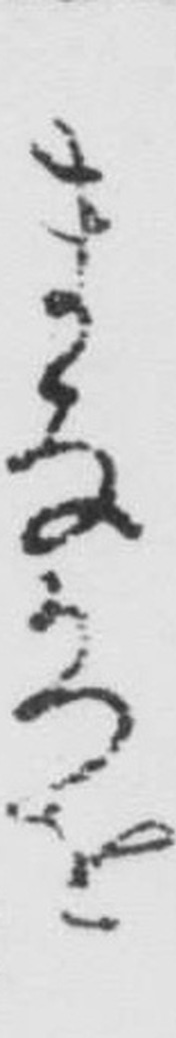まなかつを
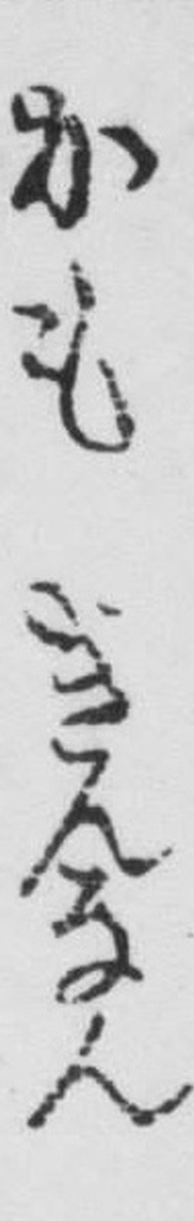かもきんなん
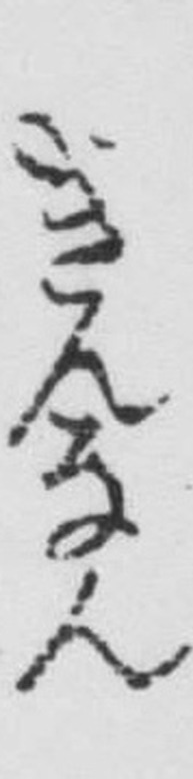ぎんなん
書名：諸家通用/即席料理
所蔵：大阪府立大学学術情報センター 国文学研究資料館
